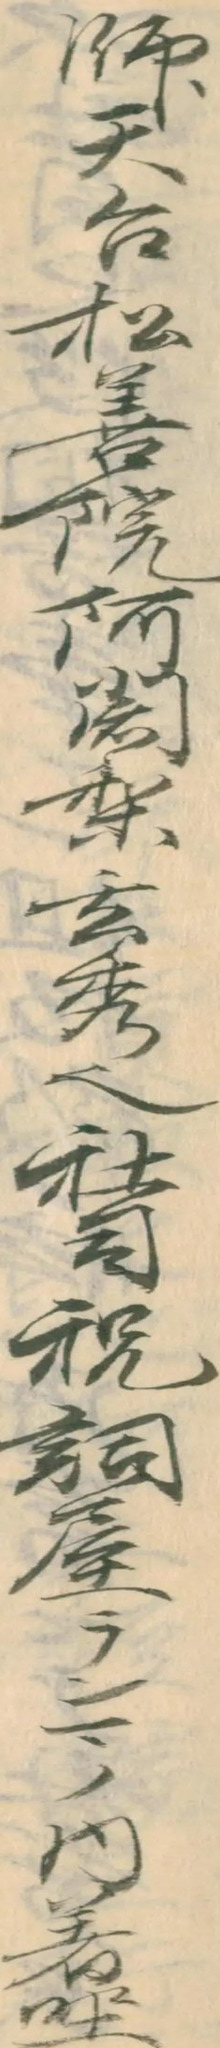師天台松善院阿闍梨玄秀也社司祝詞屋ランマノ内着坐
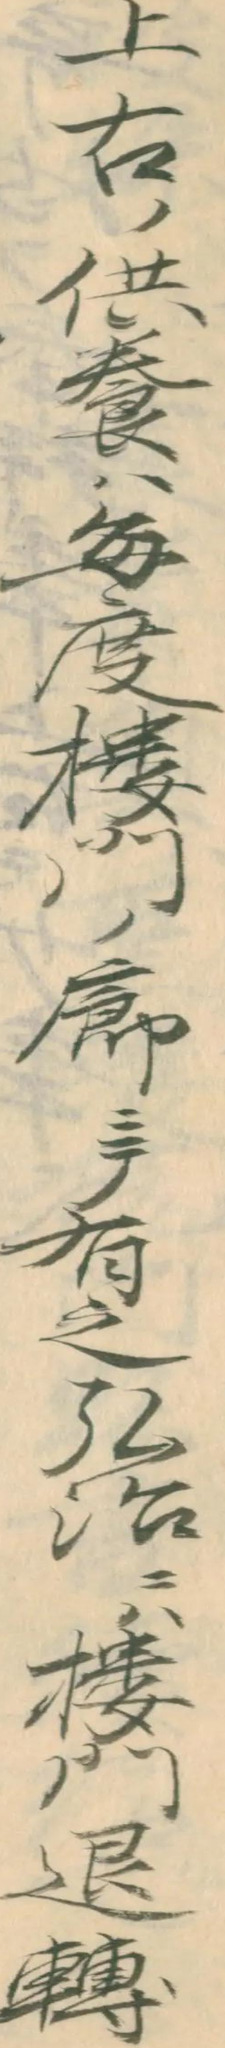上古ノ供養ハ毎度楼門ノ廊ニテ有之弘治ニハ楼門退転
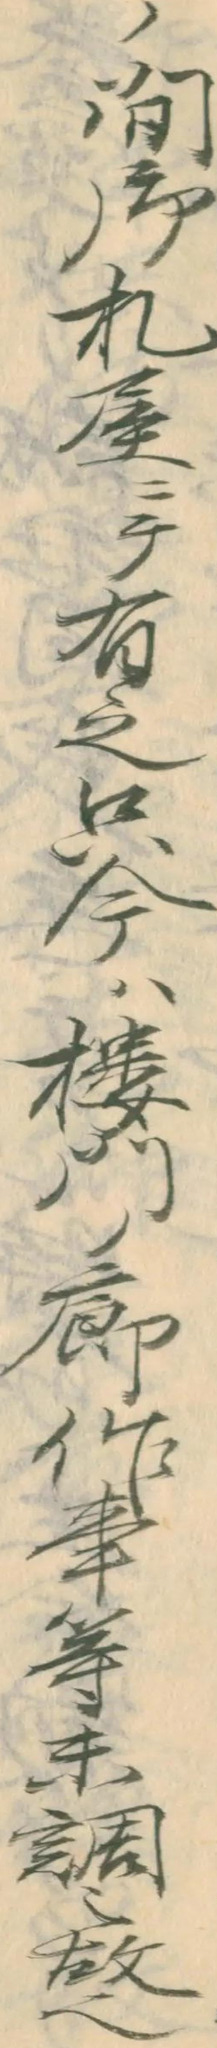ノ間御札屋ニテ有之只今ハ楼門ノ廊作事等未調之故也
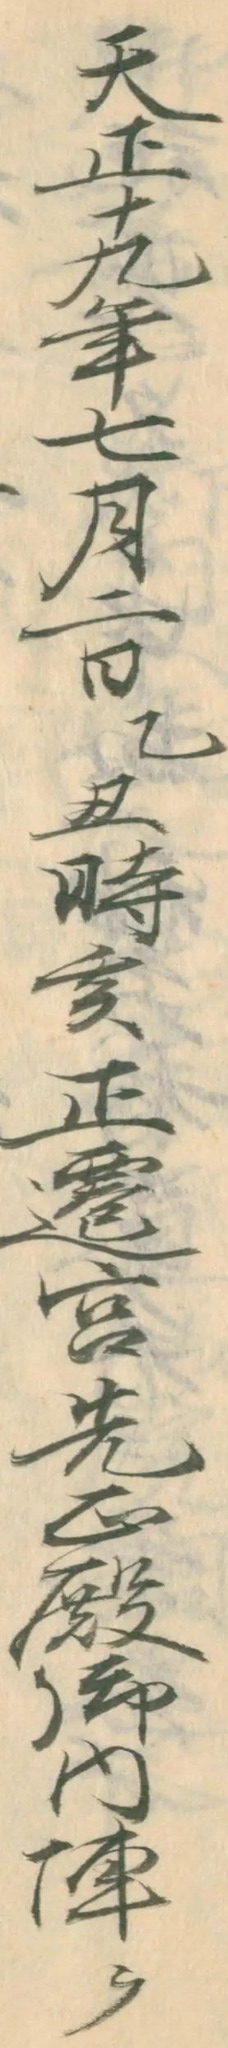一天正十九年七月二日乙丑時亥正遷宮先正殿御内陣ヲ
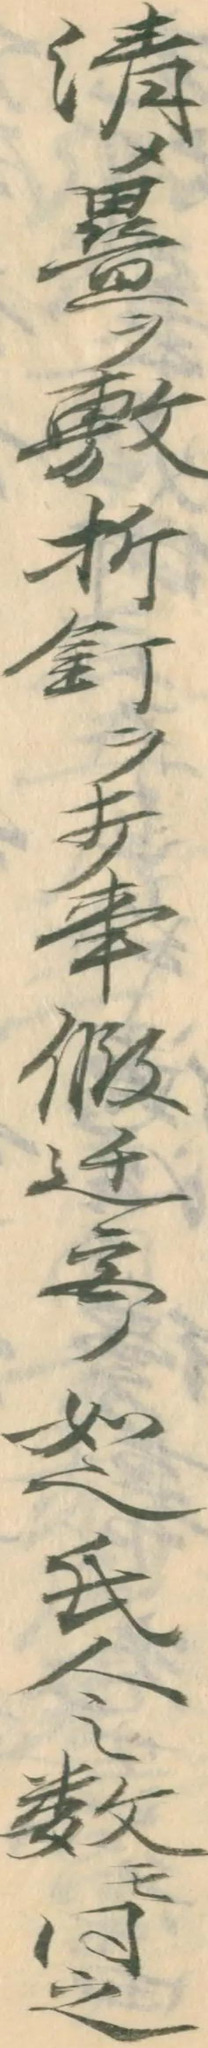清メ畳ヲ敷折釘ヲ打事仮遷宮ノ如也氏人之数モ同之
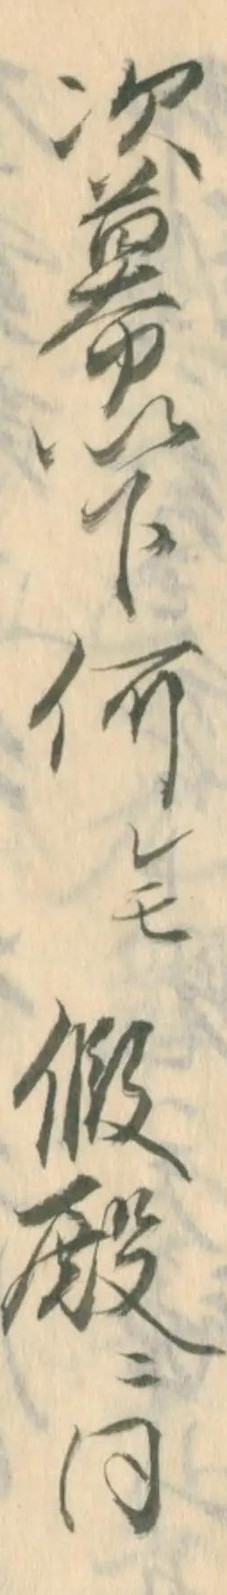次幕以下何レモ仮殿ニ同

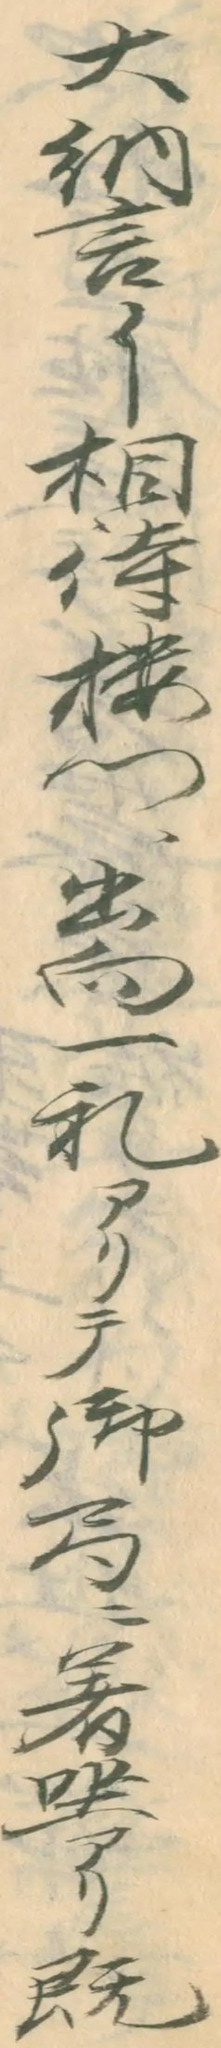大納言候事相待楼門ヘ出向一礼アリテ御局ニ着坐アリ既
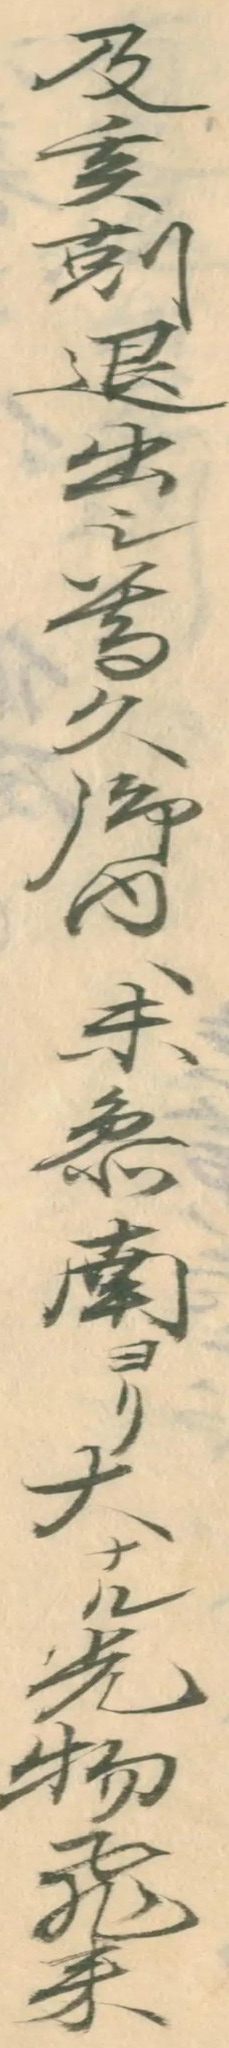及亥刻退出シ尊久御内ヘ未参南ヨリ大ナル光物飛来
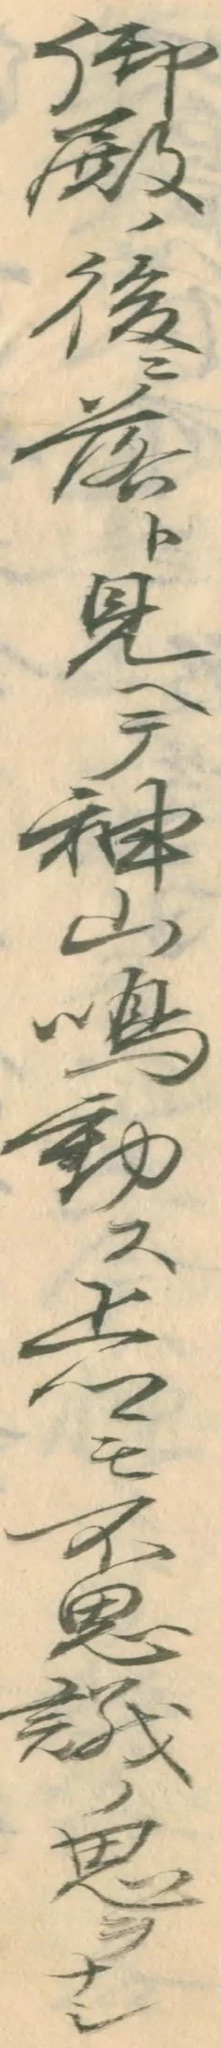御殿ノ後ニ落ト見ヘテ神山鳴動ス上卿モ不思議ノ思ヲナシ
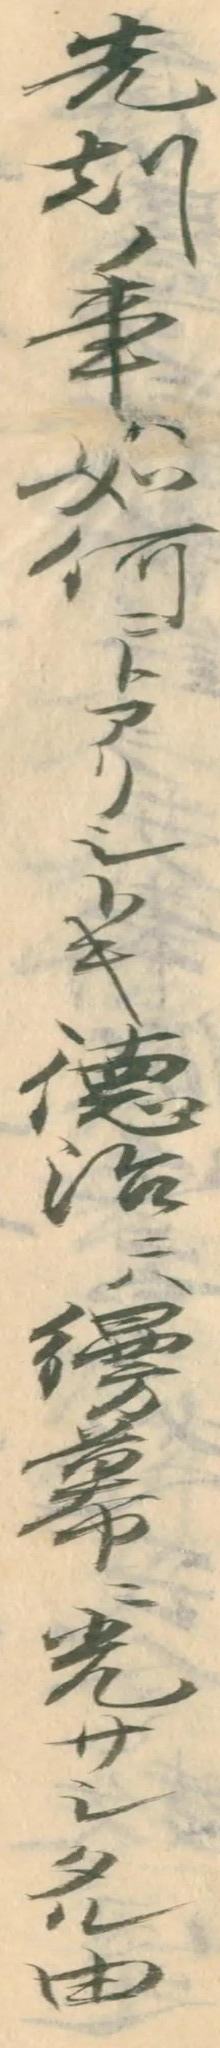先刻ノ事ハ如何ニトアリシトキ徳治ニハ縵幕ニ光サシタル由
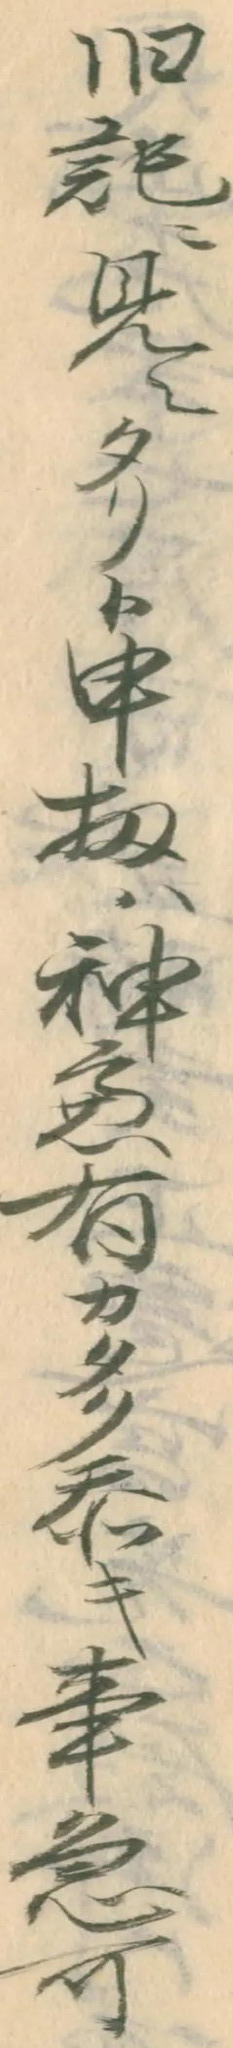旧記ニ見えタリト申扨ハ神慮有カタク忝キ事急可
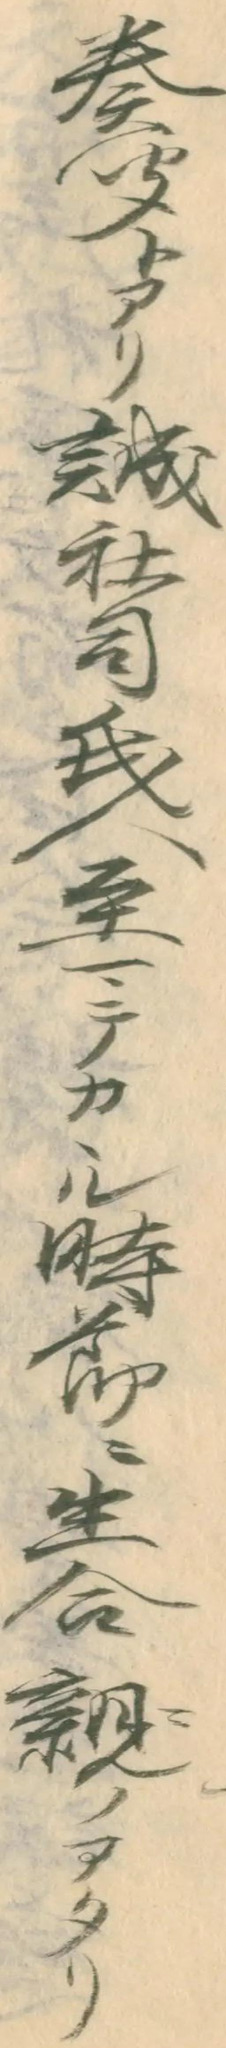奏聞トアリ誠社司氏人至マテカヽル時節ニ生合親ノアタリ
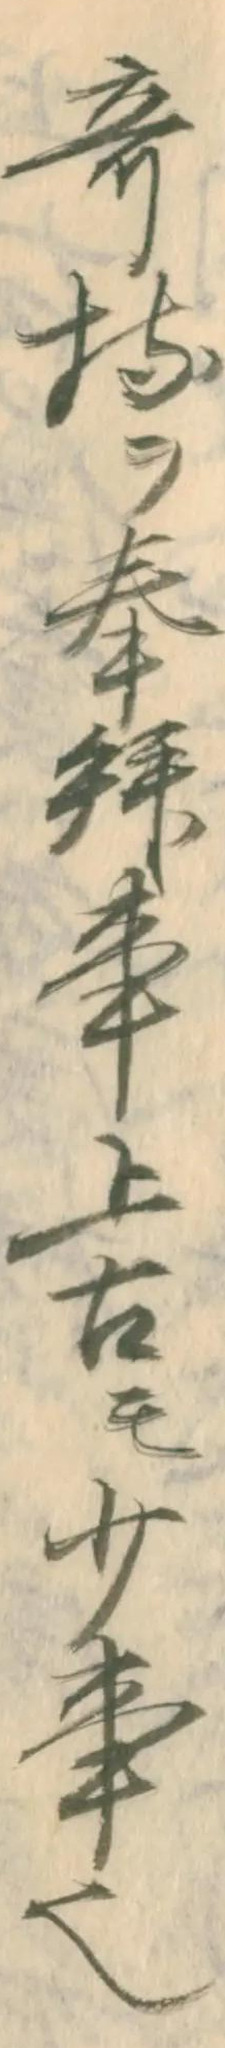奇特ヲ奉拝事上古モ少事也
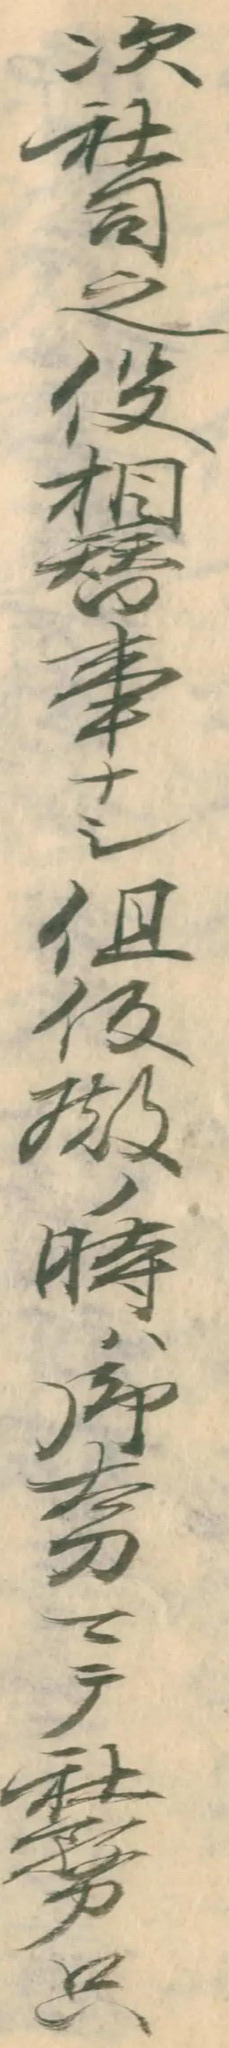次社司之役相替事ナシ但仮殿ノ時ハ御太刀マテ社務只
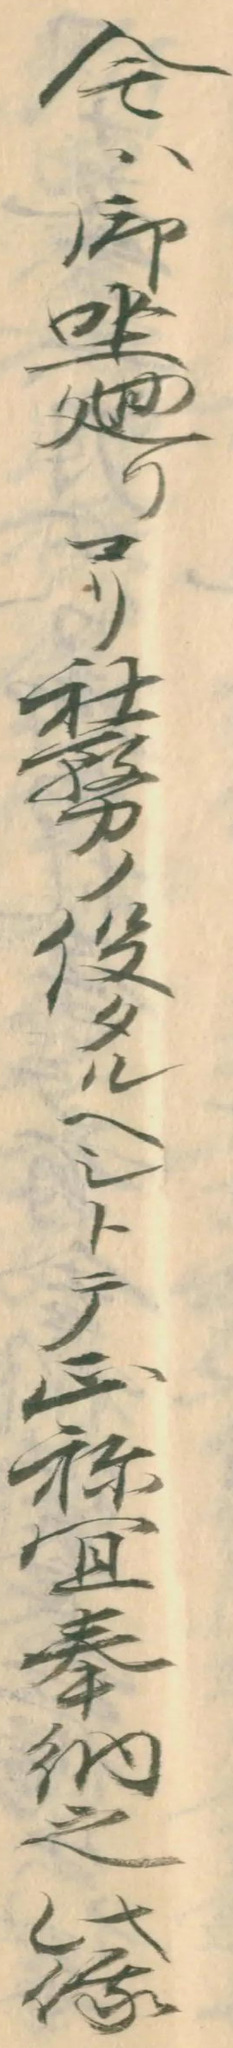今ハ御坐廻リヨリ社務ノ役タルヘシトテ正祢宜奉納之此縁
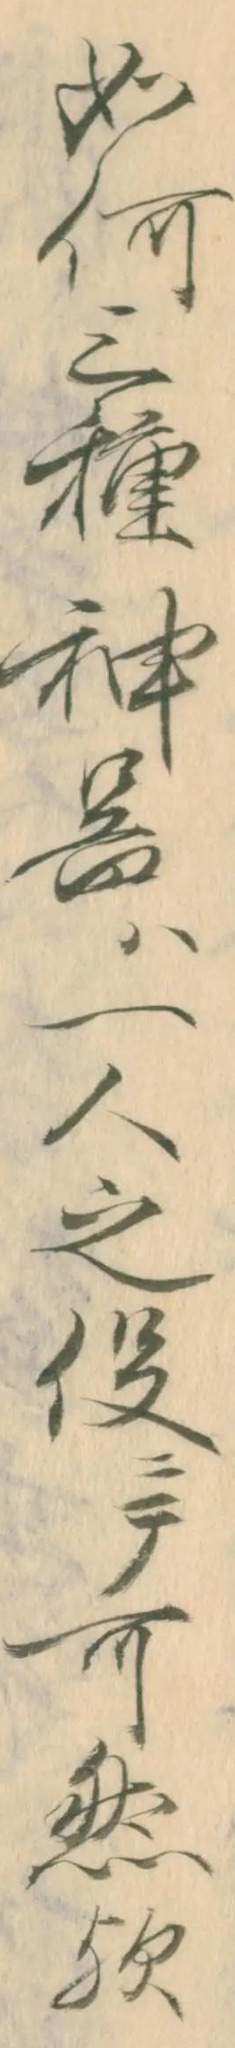如何三種神器ハ一人之役ニテ可然歟
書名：賀茂社記録. 第15冊
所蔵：国立国会図書館 National Diet Library, JAPAN
